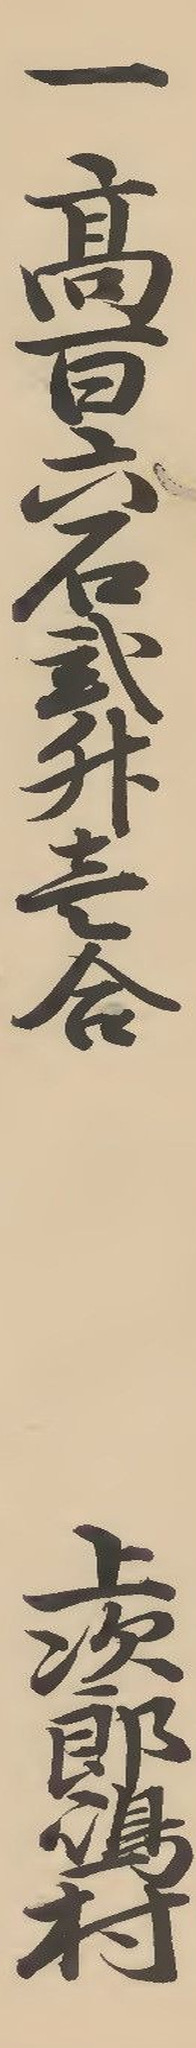一高百六石弐升壱合上次郎島村
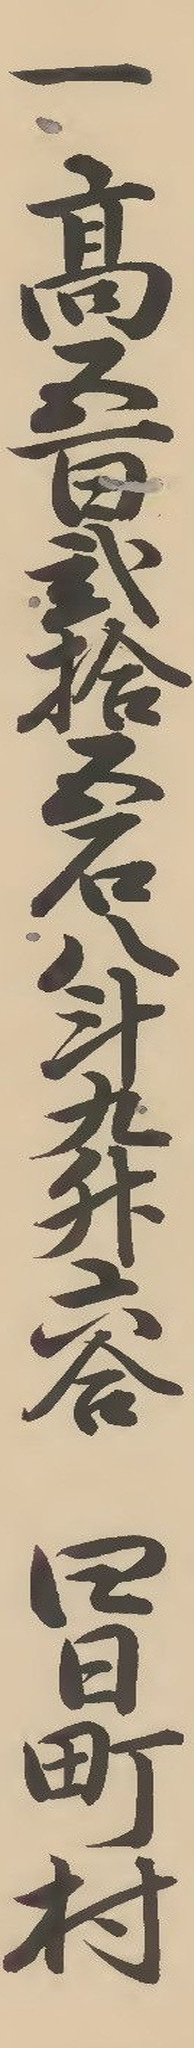一高五百弐拾五石八斗九升六合四日町村

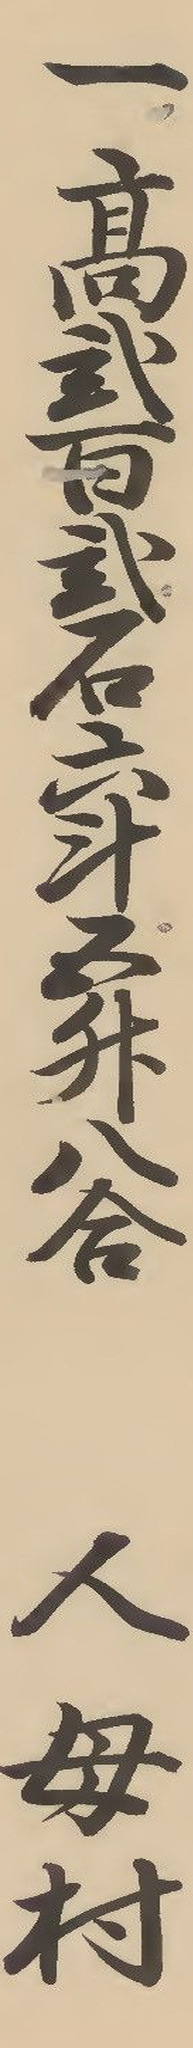一高弐百弐石六斗五升八合人母村
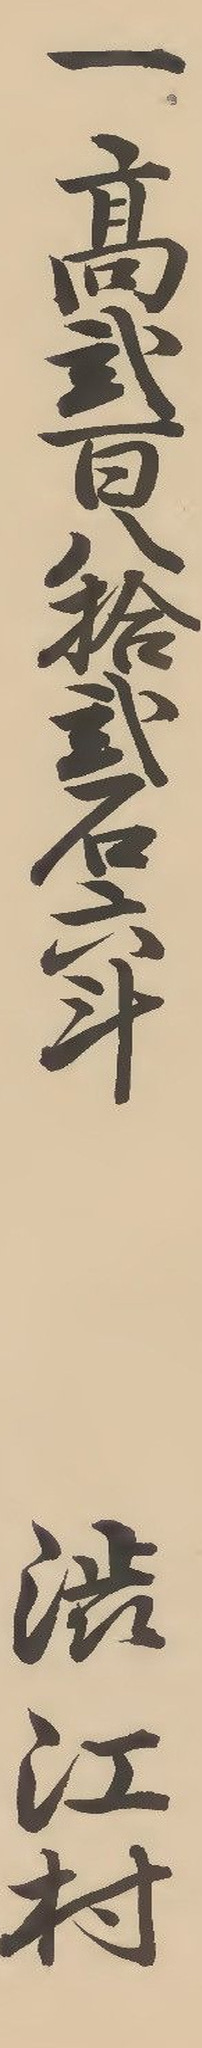一高弐百八拾弐石六斗渋江村
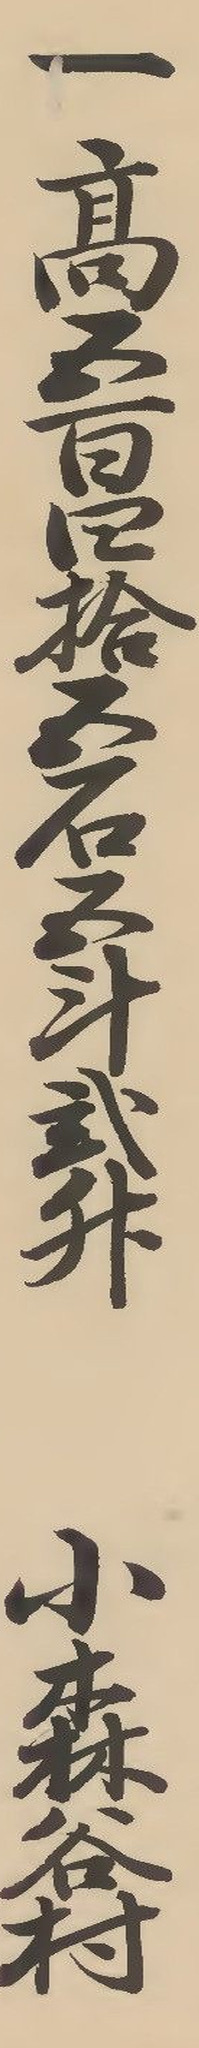一高五百四拾五石五斗弐升小森谷村
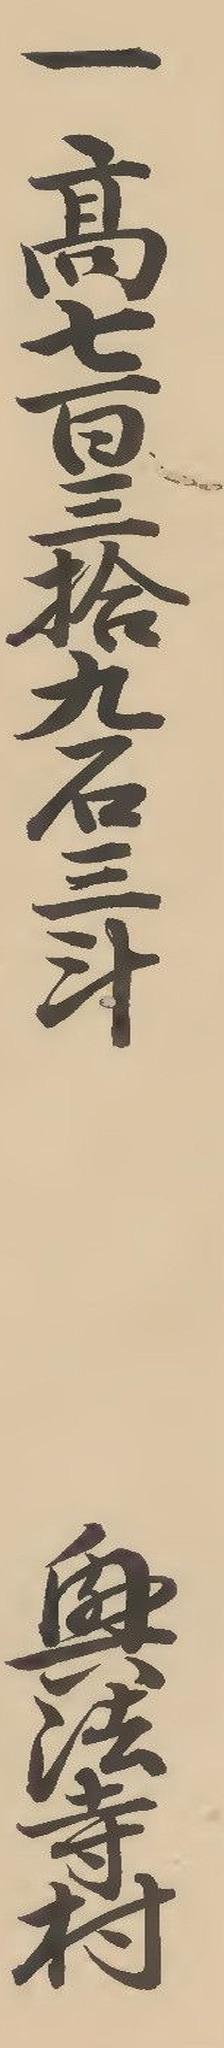一高七百三拾九石三斗興法寺村
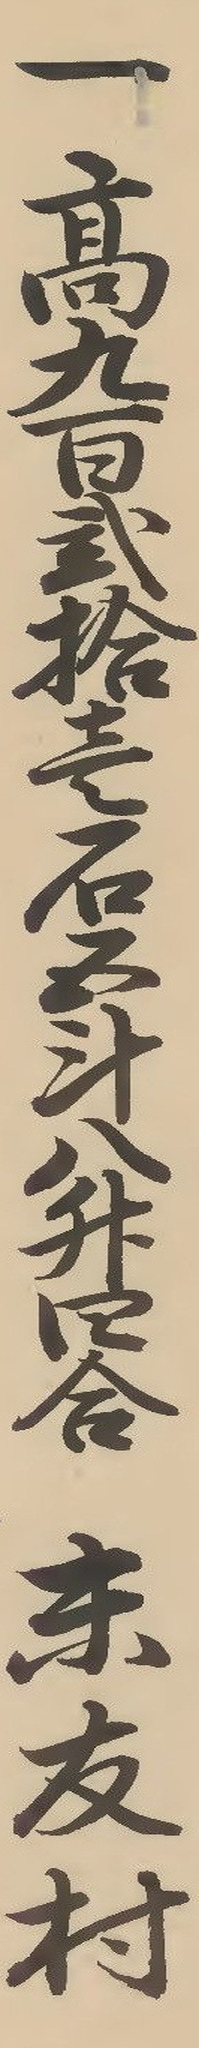一高九百弐拾壱石五斗八升四合末友村

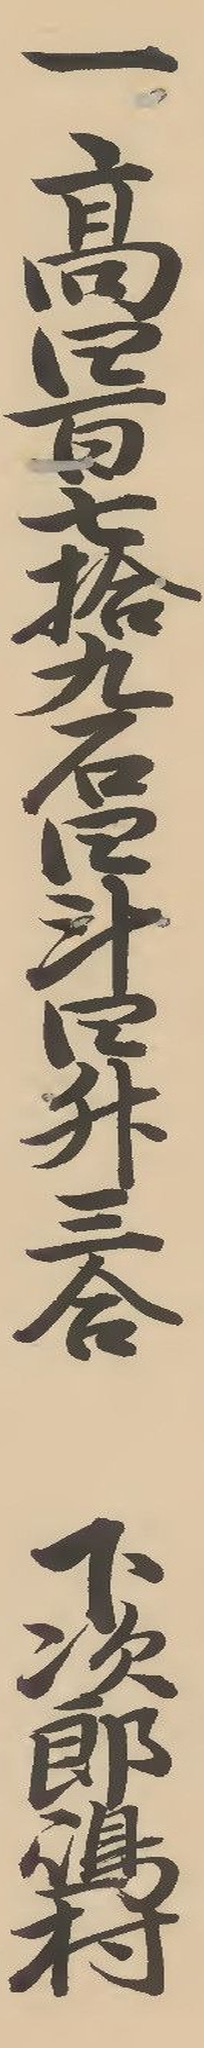一高四百七拾九石四斗四升三合下次郎島村
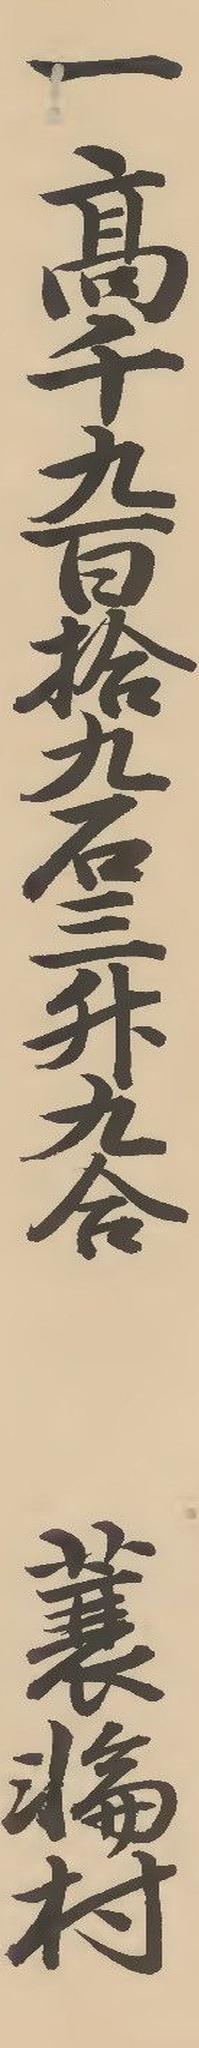一高千九百拾九石三升九合蓑輪村
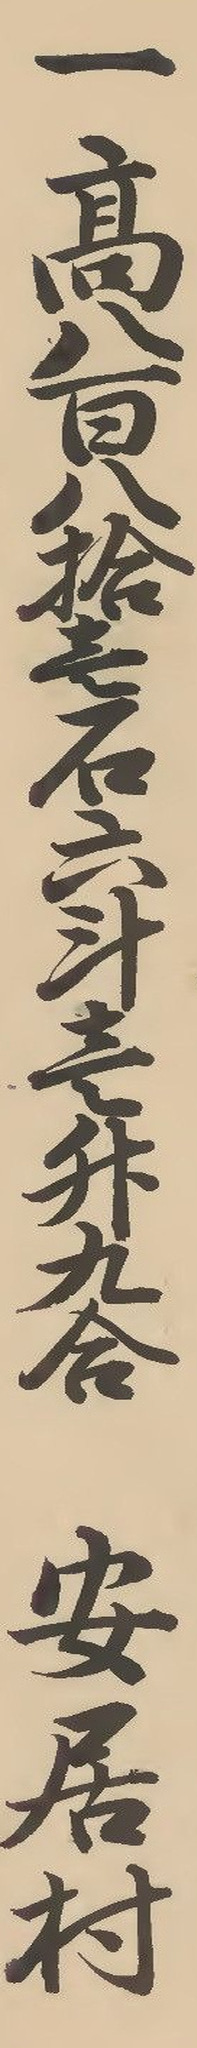一高八百八拾壱石六斗壱升九合安居村
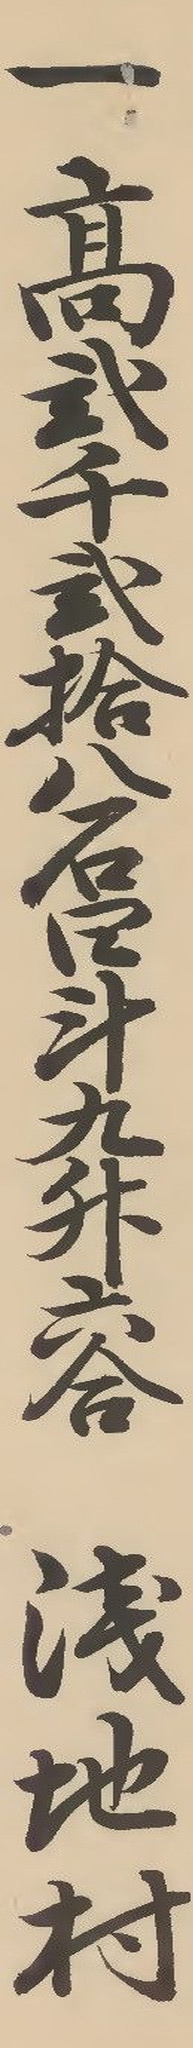一高弐千弐拾八石四斗九升六合浅地村
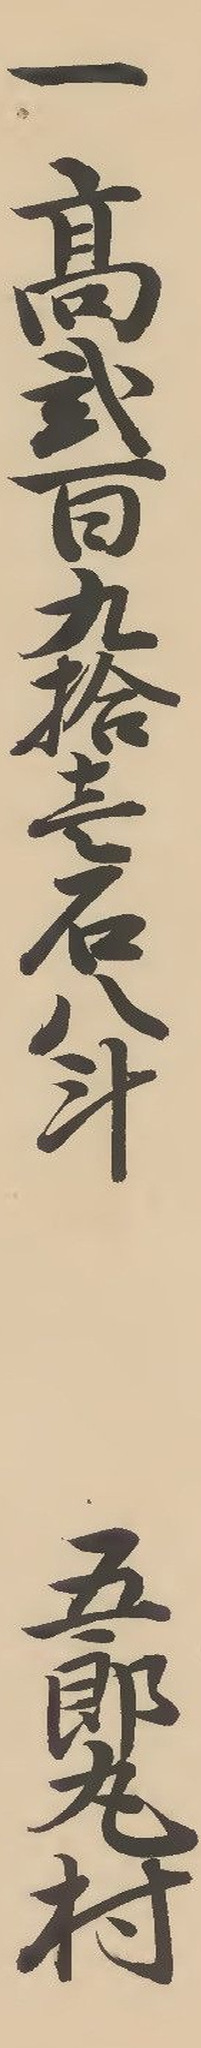一高弐百九拾壱石八斗五郎丸村
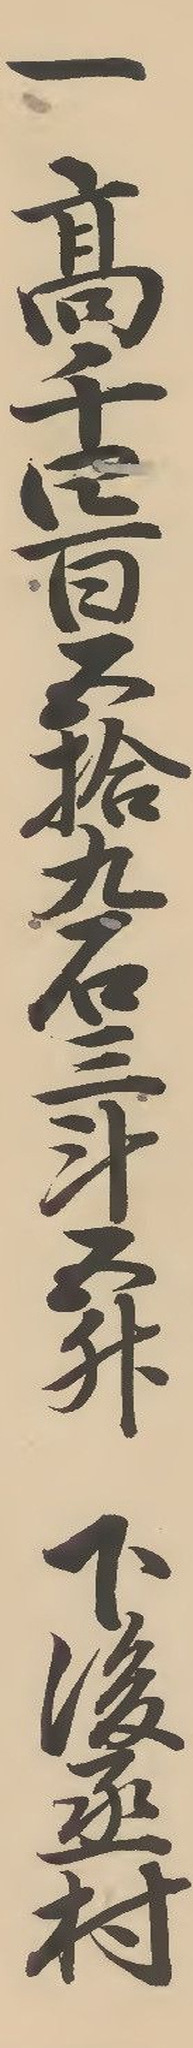一高千四百五拾九石三斗五升下後丞村

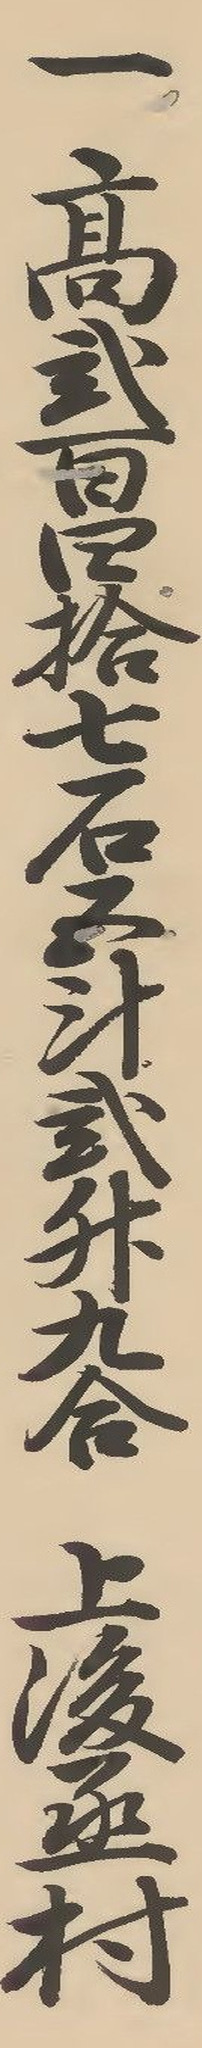一高弐百四拾七石五斗弐升九合上後丞村
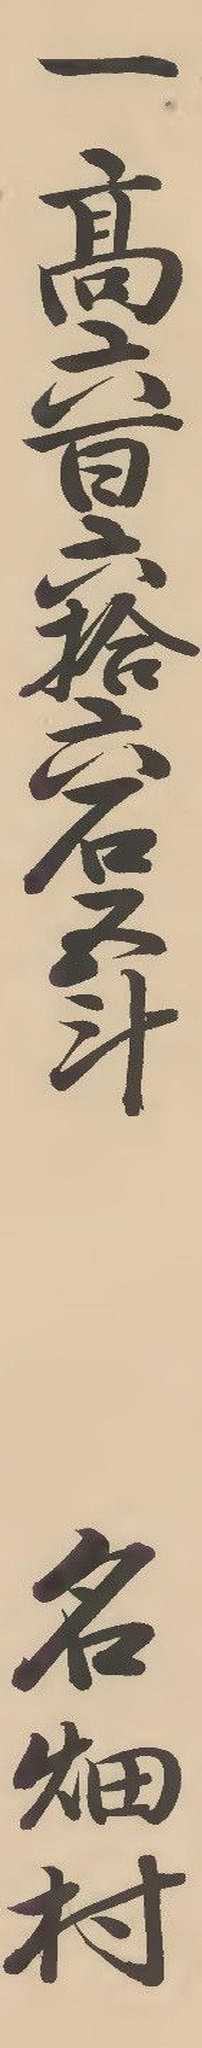一高六百六拾六石五斗名畑村
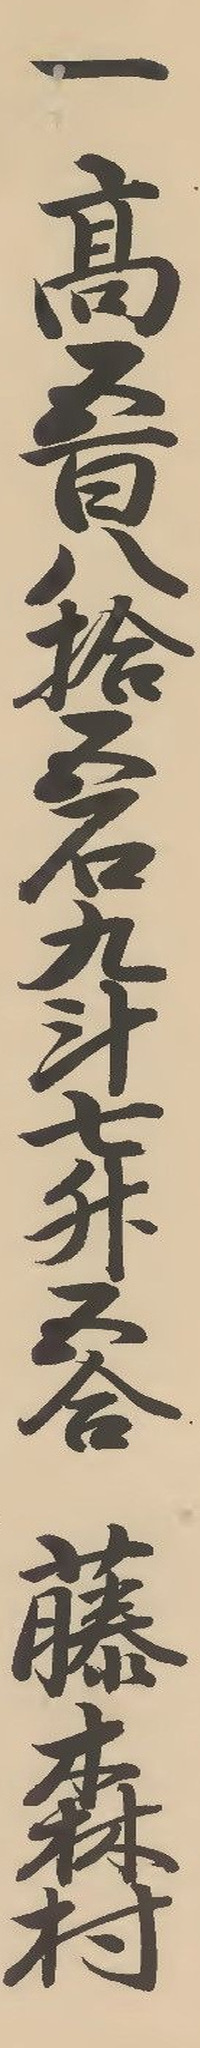一高五百八拾五石九斗七升五合藤森村
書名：越中国郷帳
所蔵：国立公文書館 National Archives of Japan
